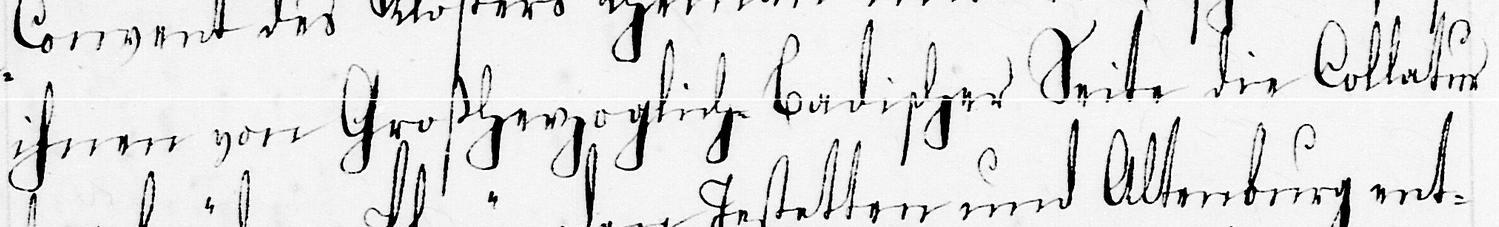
ihnen von Großherzoglich Badischer Seite die Collatur
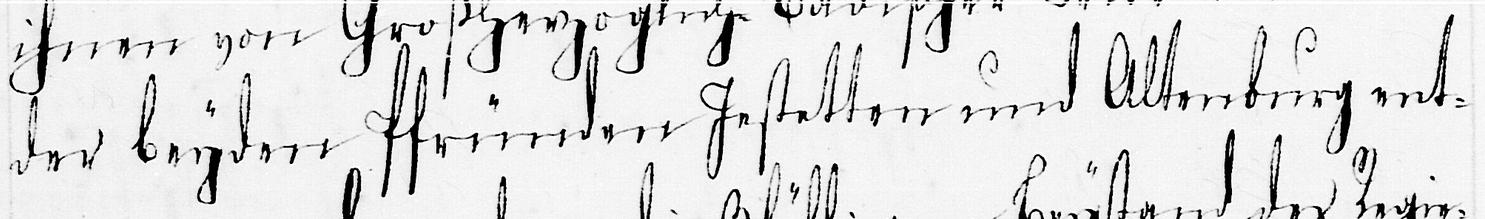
der beyden Pfründen Jestetten und Altenburg ent¬
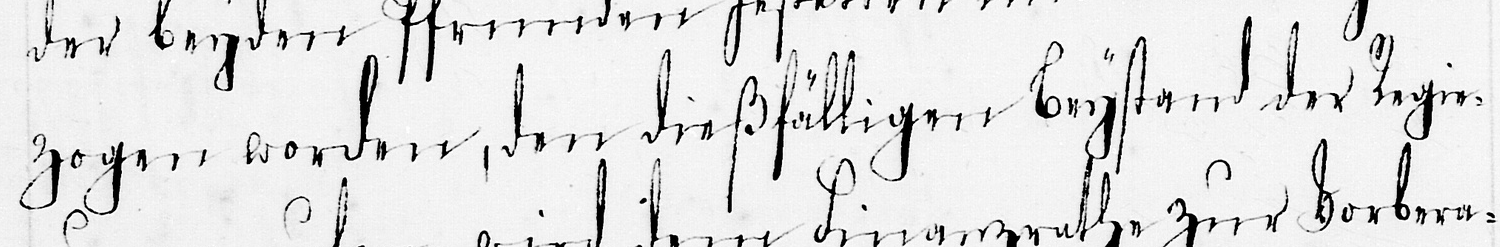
zogen worden, den dießfälligen Beystand der Regie¬
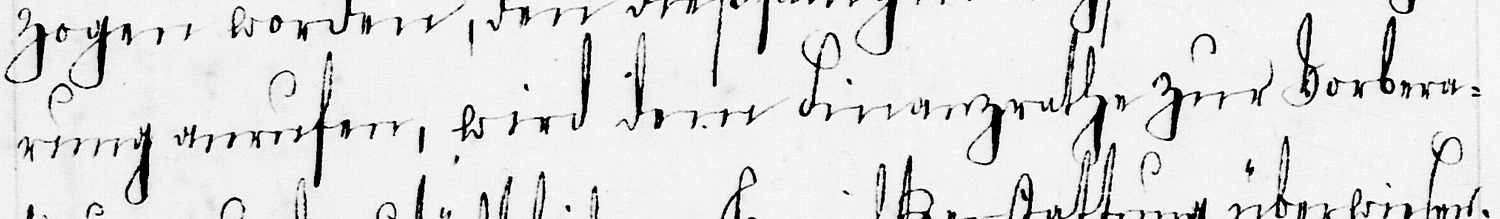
rung anrufen, wird dem Finanzrathe zur Vorbera¬
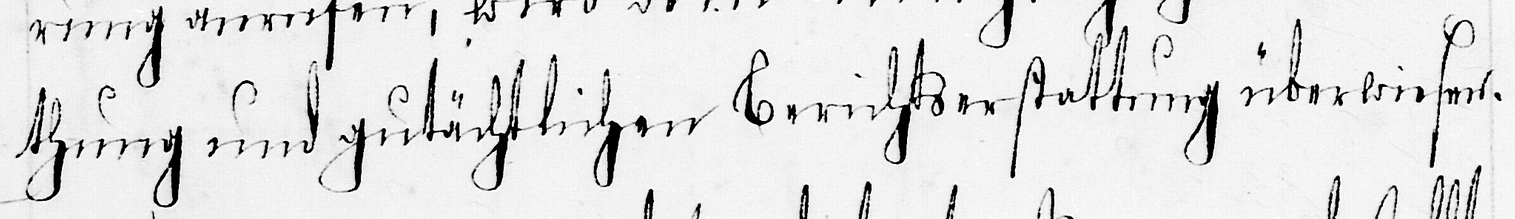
thung und gutächtlichen Berichtserstattung überwiesen.
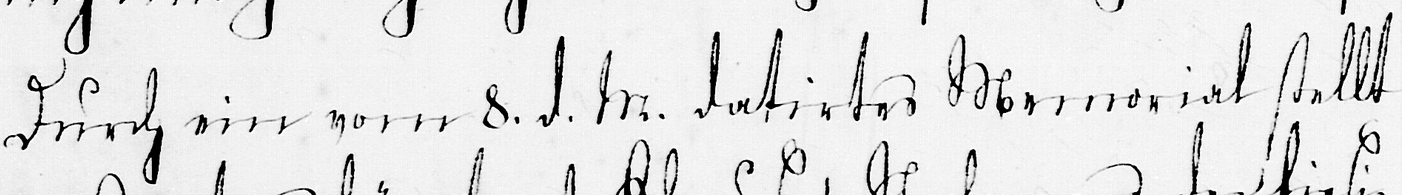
Durch ein vom 8. d. M. datirtes Memorial stellt
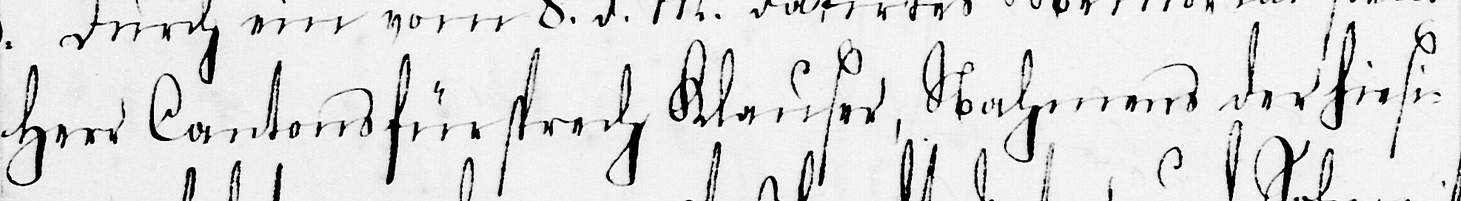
Herr Cantonsfürsprech Klauser, Nahmens der hiesi¬
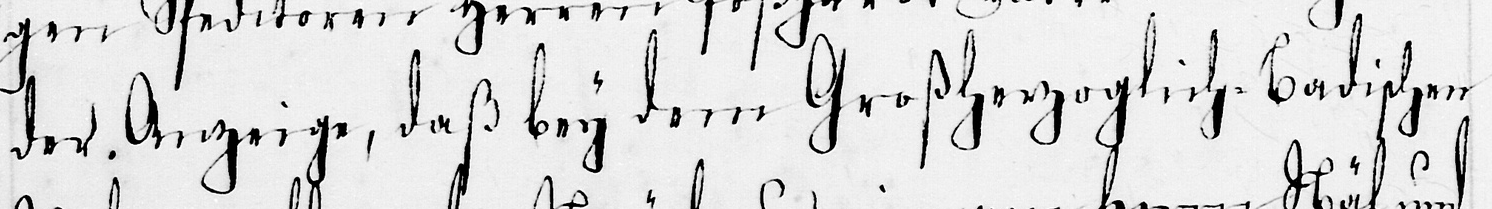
der Anzeige, daß bey dem Großherzoglich-Badischen
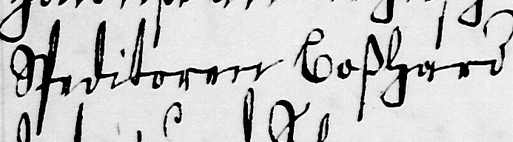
Speditoren Herren
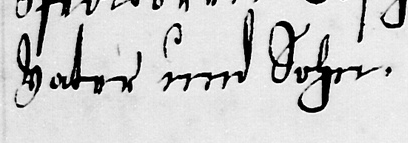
Vater und Sohn
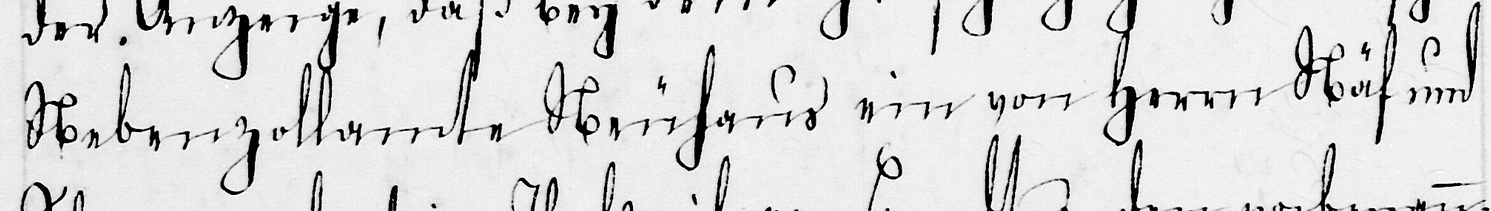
Nebenzollamte Neuhaus ein von Herrn Näf und
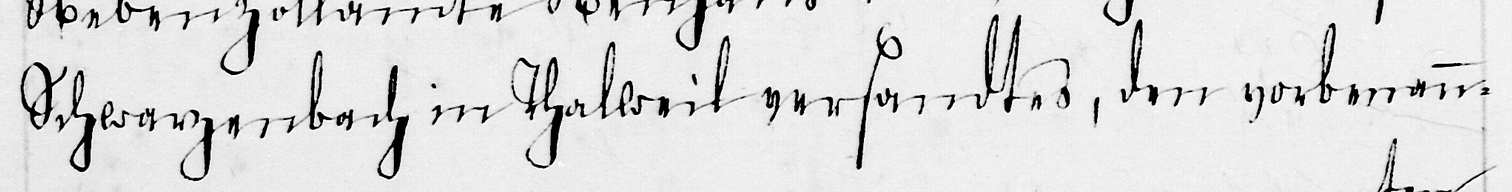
Schwarzenbach in Thalweil versandtes, den vorbenann-
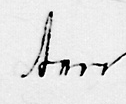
gen
